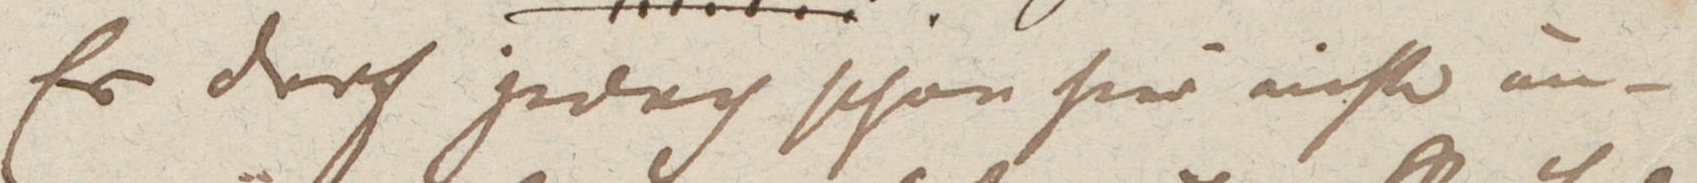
Es darf jedoch schon hier nicht un-
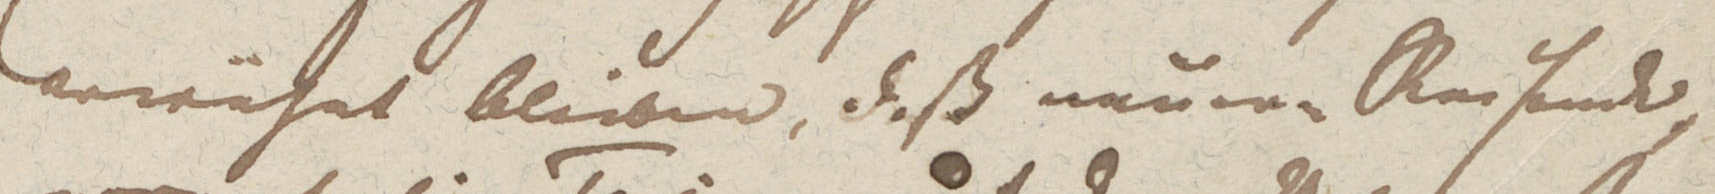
erwähnt bleiben, dass neuere Reisende,
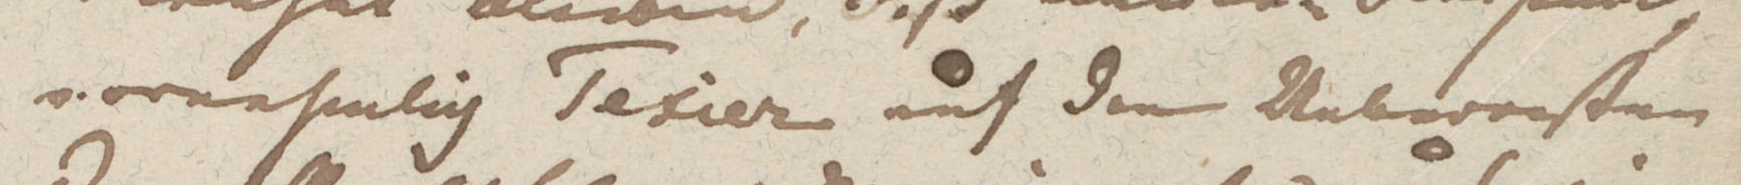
vornehmlich Texier auf den Ueberresten
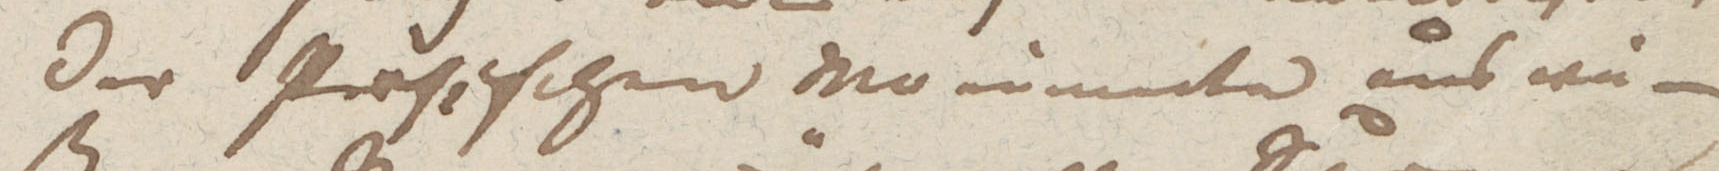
der Persischen Monumente aus wei-
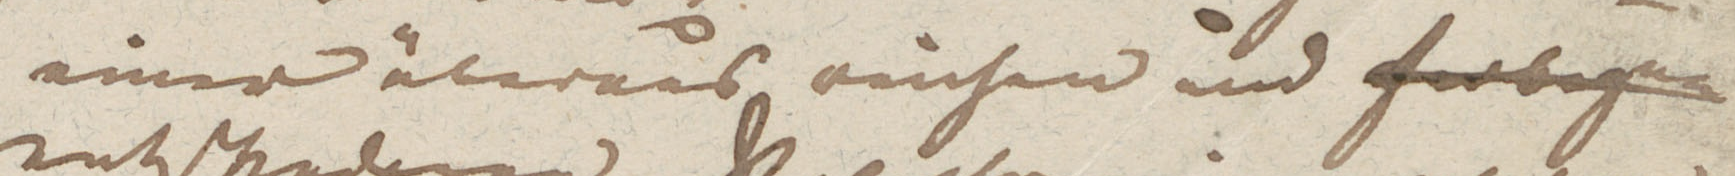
einer überaus reichen und farbigen
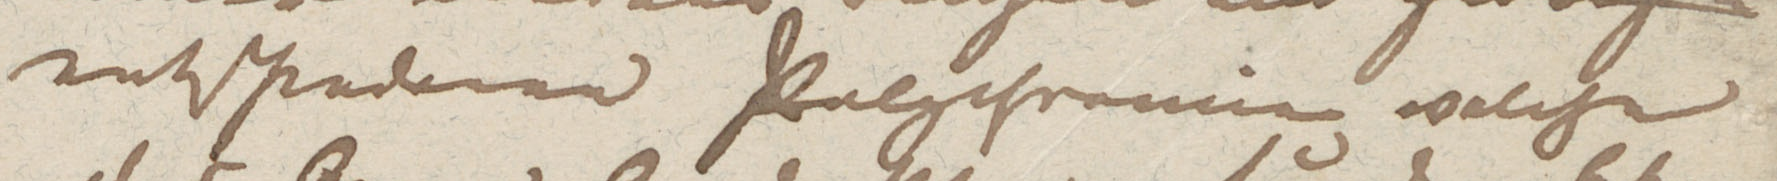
entschiedenen Polychromie welche
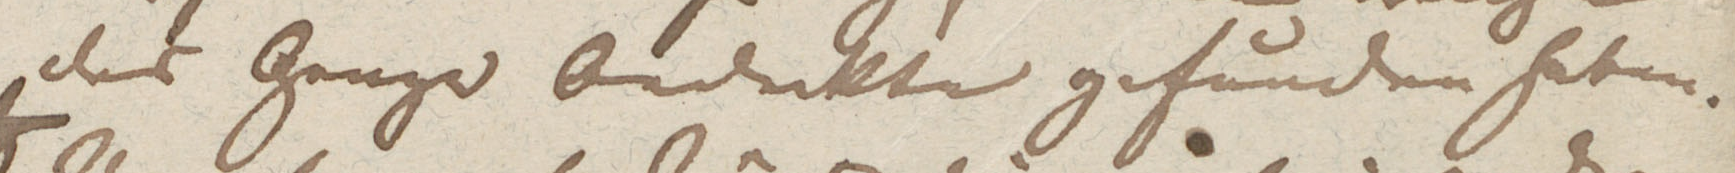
das Ganze bedeckte gefunden haben.
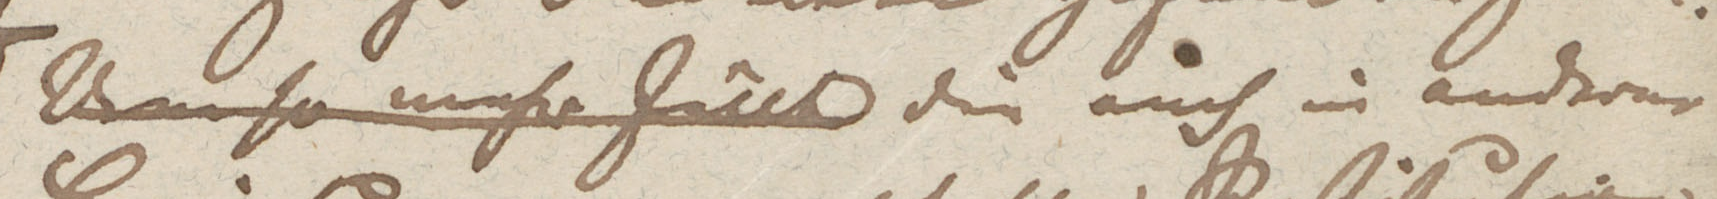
Umso mehr fällt die auch in anderer
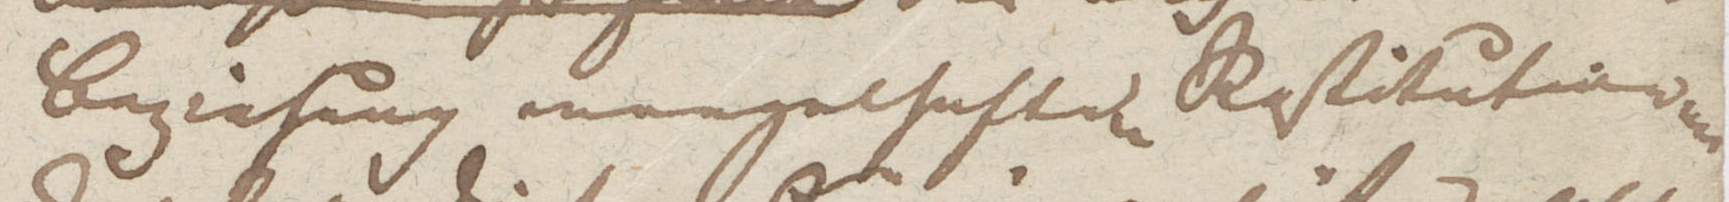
Beziehung mangelhaften Restitutionen
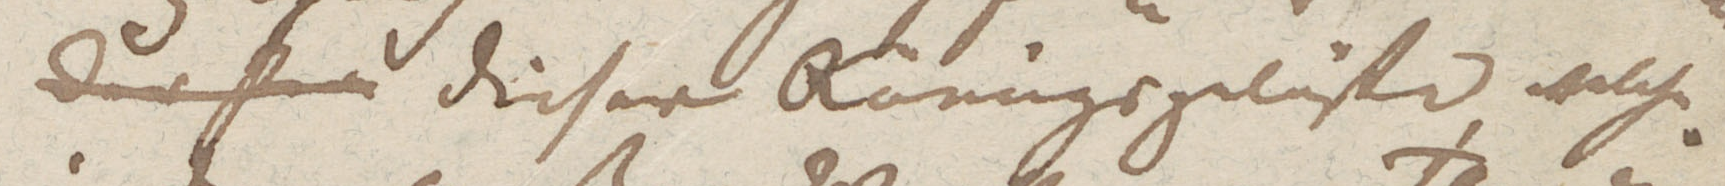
der I dieser Königspaläste, welche
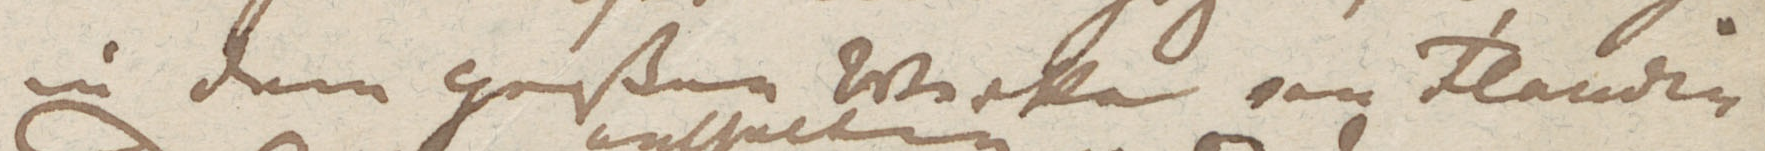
in dem grossen Werke von Flandin
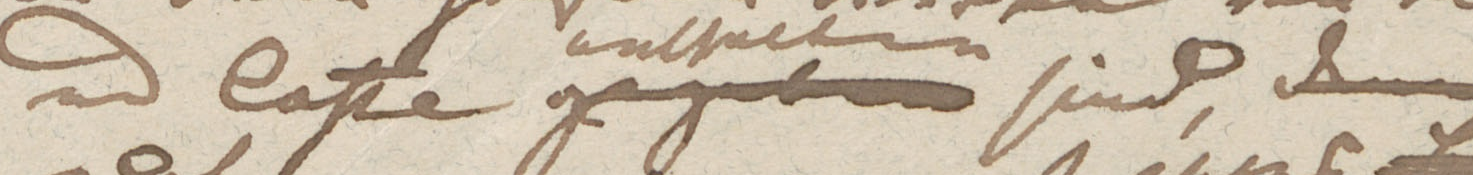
und Coste gegeben enthalten sind, denen
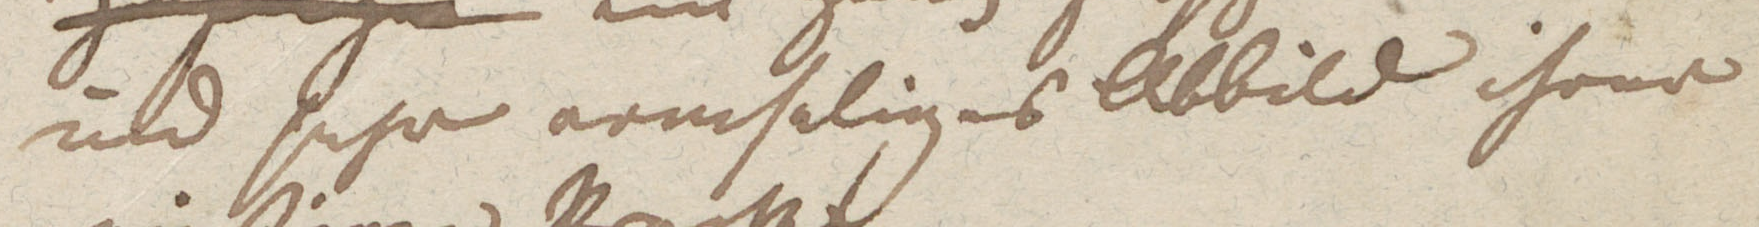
und sehr armseliges Abbild ihrer
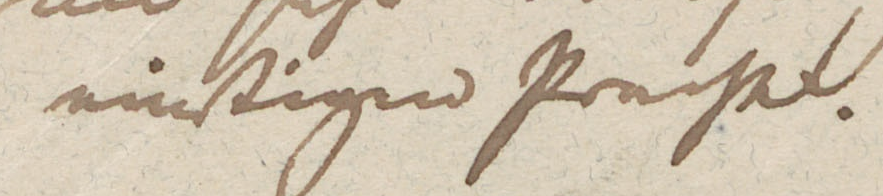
einstigen Pracht.
